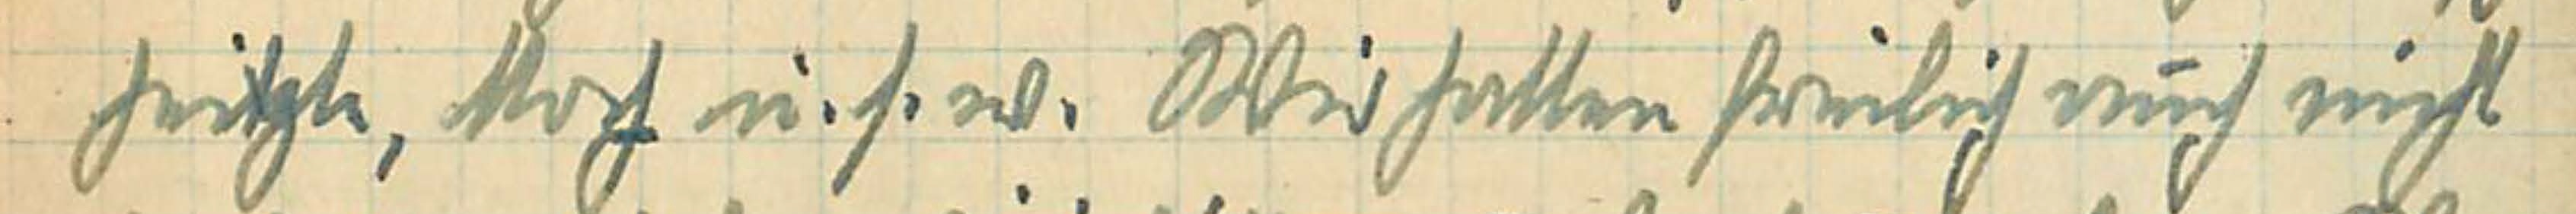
heitzte, koch u. s. w. Wir hatten freilich auch nicht
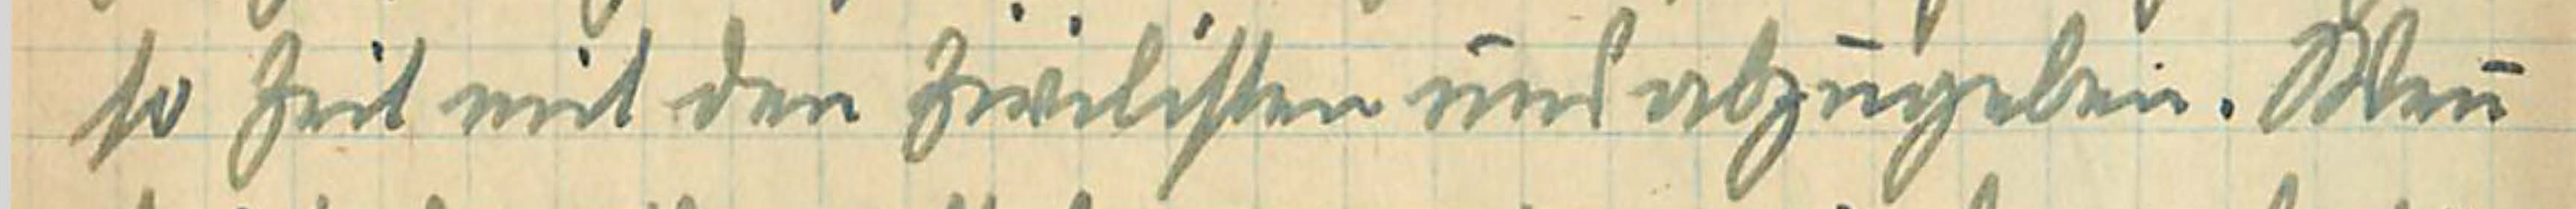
so Zeit mit den Zivilisten uns abzugeben. Wenn
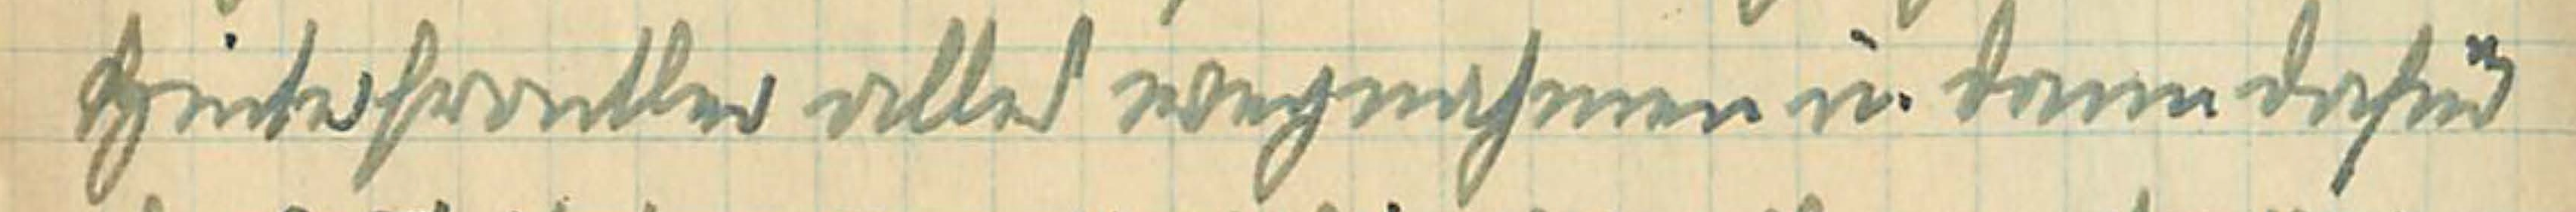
Hinterfrontler alles wegnahmen u. dann dafür
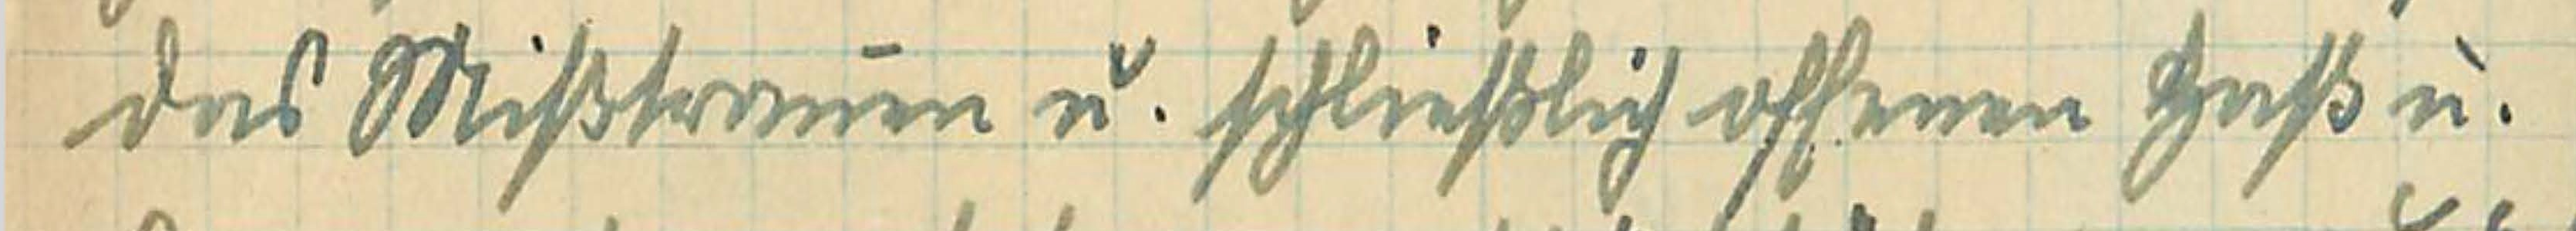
das Mißtrauen u. schließlich offenen Haß u.
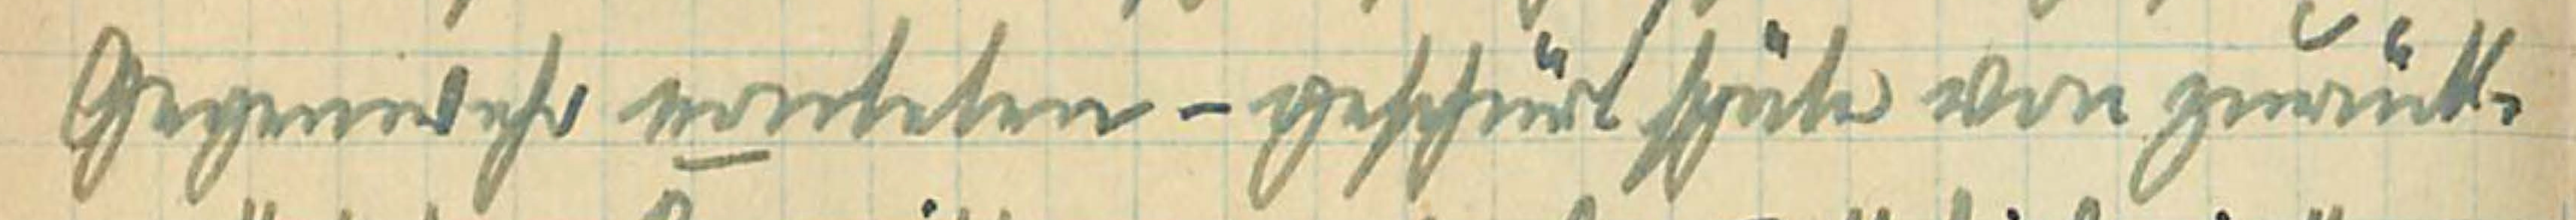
Gegenwehr ernteten – geschürt später von zurück-
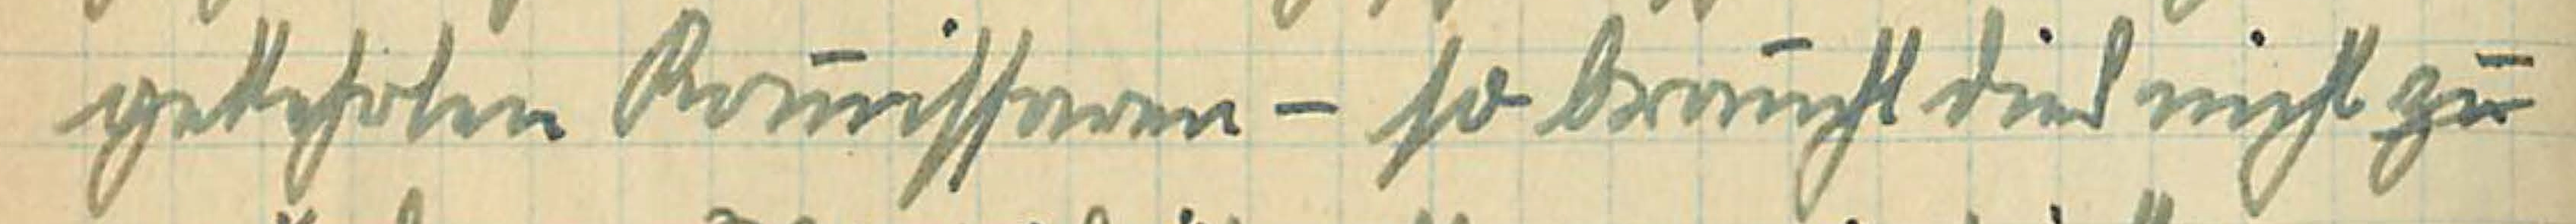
gekehrten Kommissaren – so braucht dies nicht zu
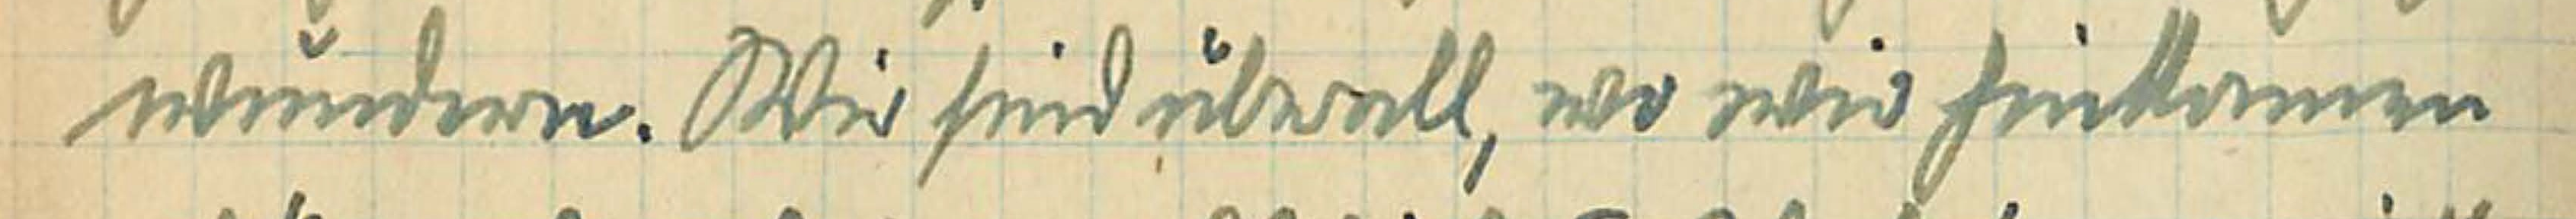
wundern. Wir sind überall, wo wir hinkamen
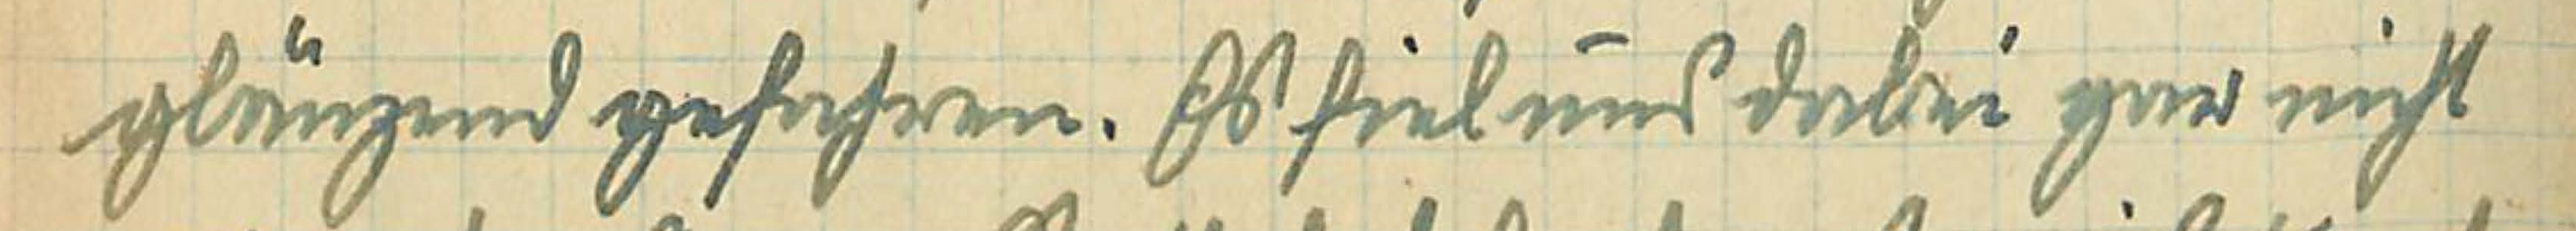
glänzend gefahren. Es fiel uns dabei gar nicht
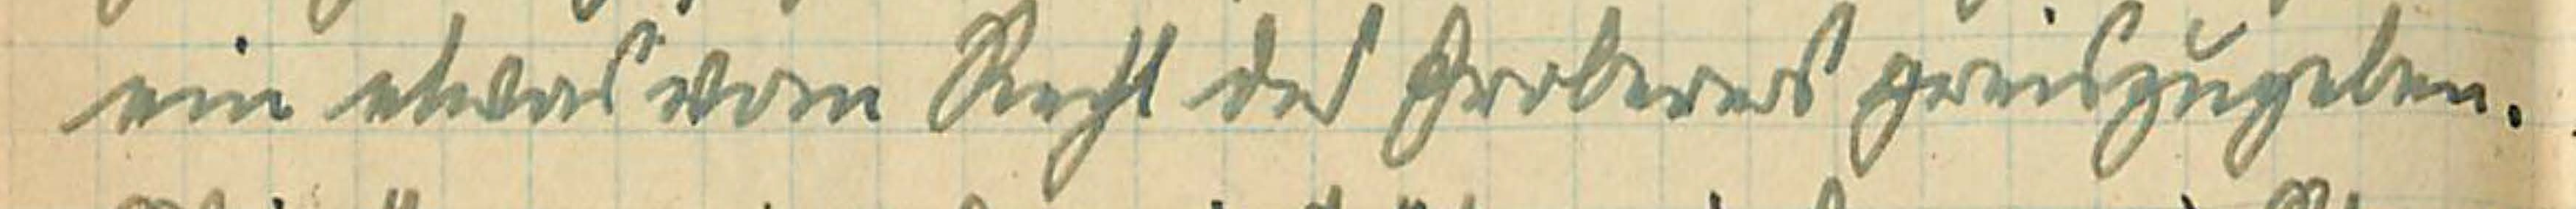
ein etwas vom Recht des Eroberers preiszugeben.
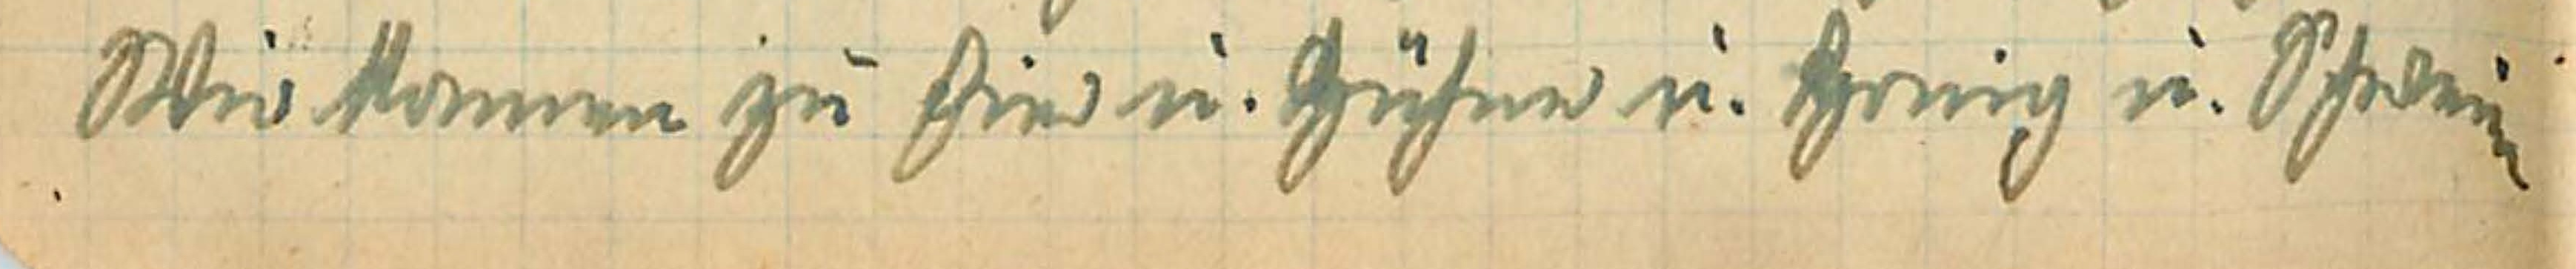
Wir kamen zu Eier u. Hühner u. Honig u. Schweinen
